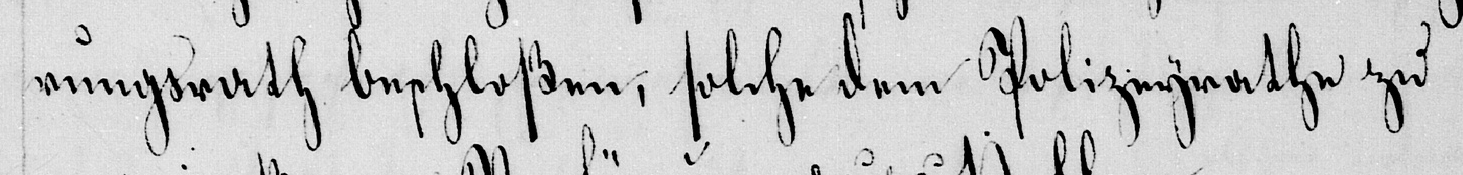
rungsrath beschloßen, solche dem Polizeyrathe zu
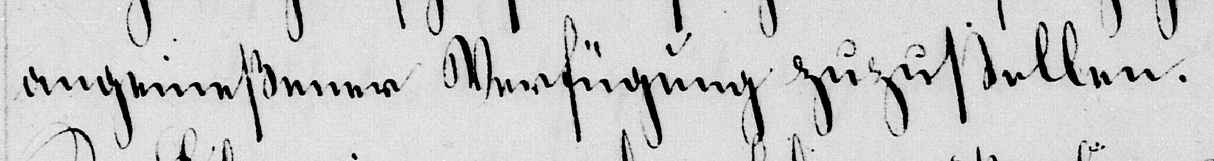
angemeßener Verfügung zuzustellen.
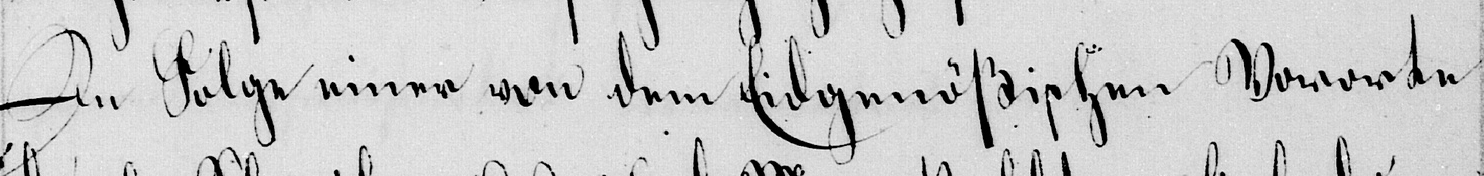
In Folge einer von dem Eidgenößischen Vororte
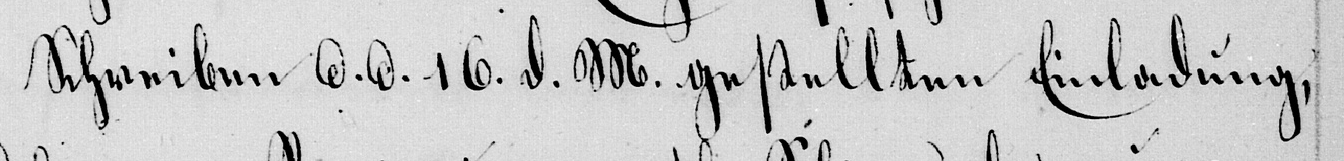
Schreiben d. d. 16. d. M. gestellten Einladung
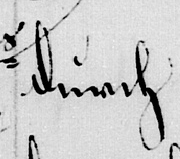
durch
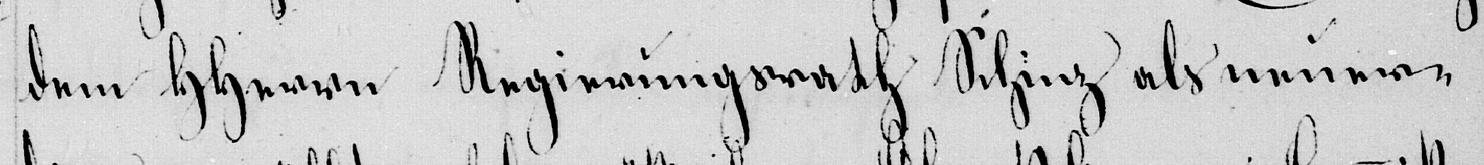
dem Herrn Regierungsrath Schinz als neuer¬
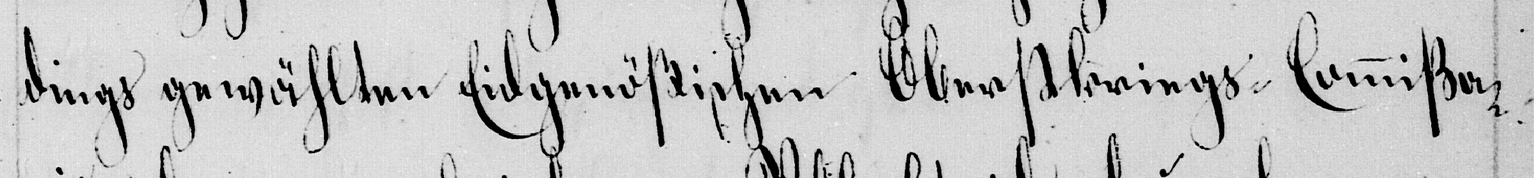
dings gewählten Eidgenößischen Oberstkriegs-Commißa¬
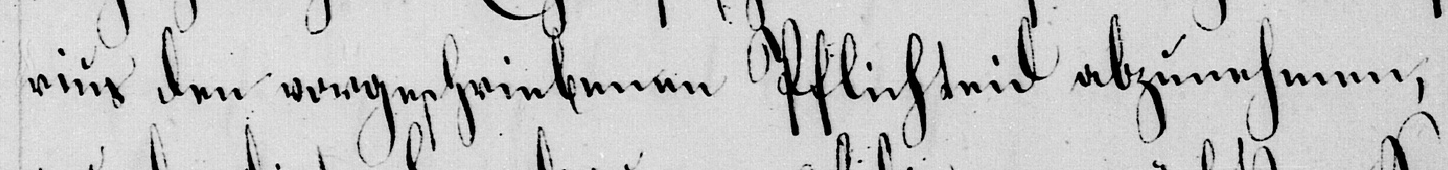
rius den vorgeschriebenen Pflichteid abzunehmen,
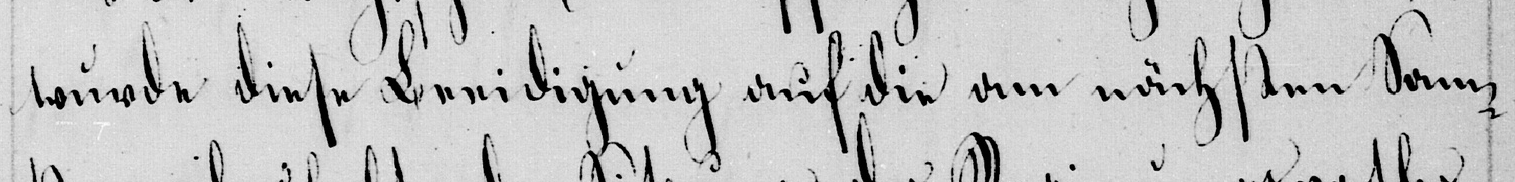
wurde diese Vereidigung auf die am nächsten Sam¬
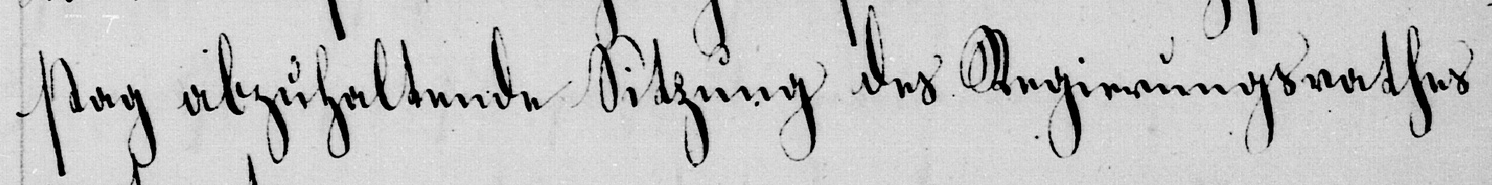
stag abzuhaltende Sitzung des Regierungsrathes
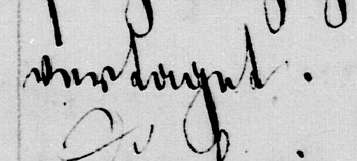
vertaget.
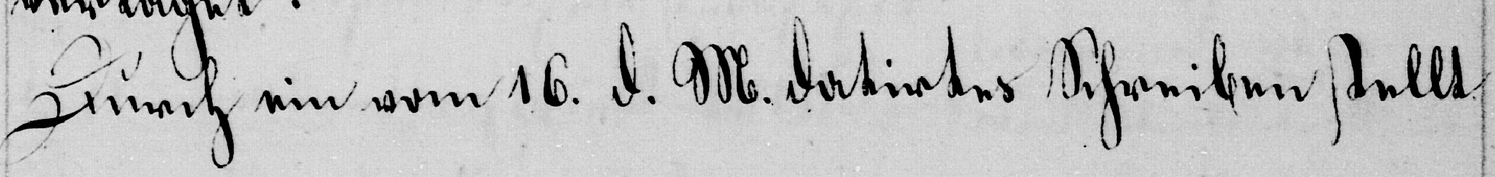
Durch ein vom 16. d. M. datirtes Schreiben stellt
